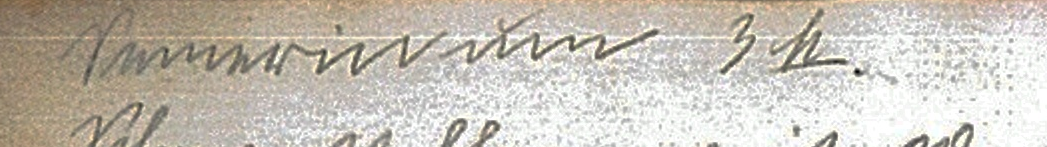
Semwin um 3h.
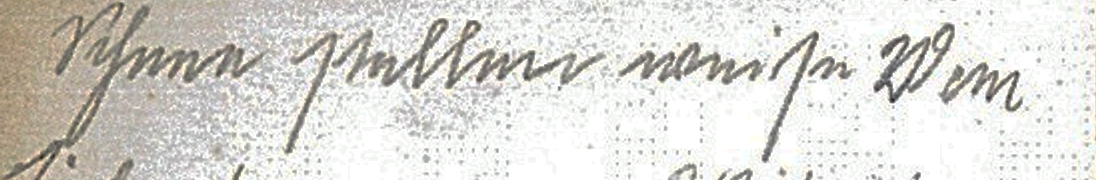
Schnee stellen weise 20 cm
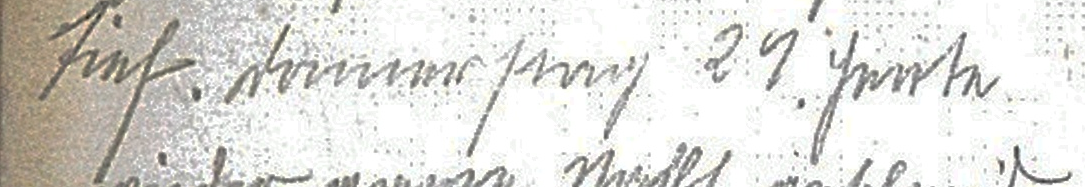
tief. Donnerstag 21.Heute
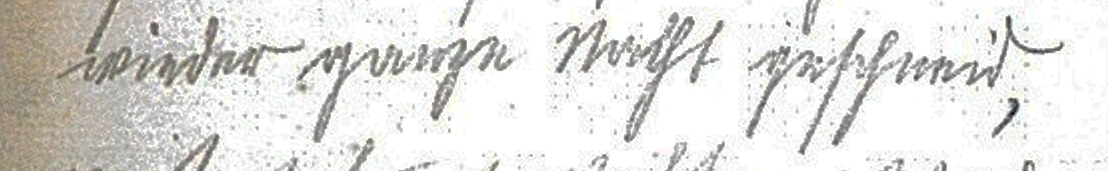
wieder ganz Nacht geschneit,
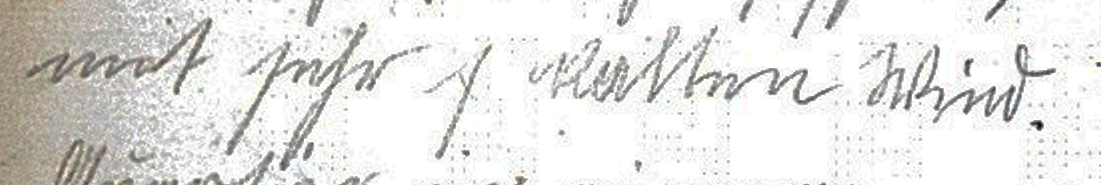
mit sehr kaltem Wind.
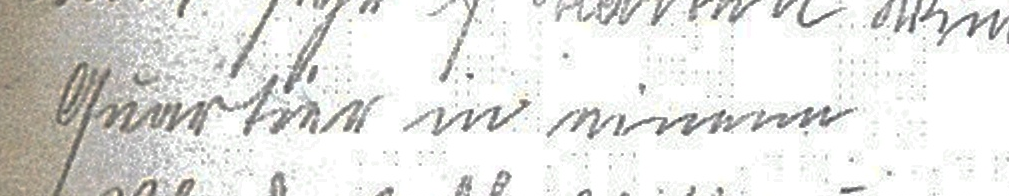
Quartier in einem
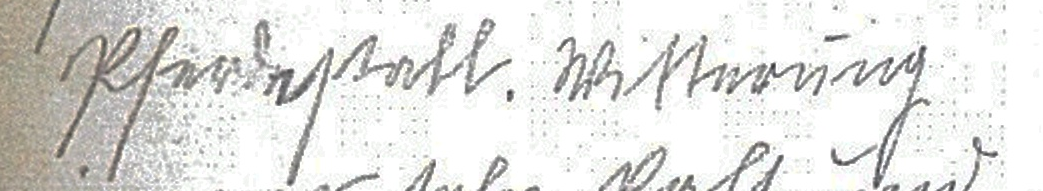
Pferdestall. Witterung
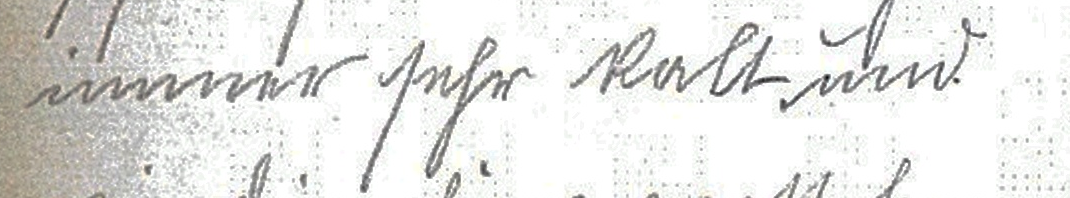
immer sehr kalt und
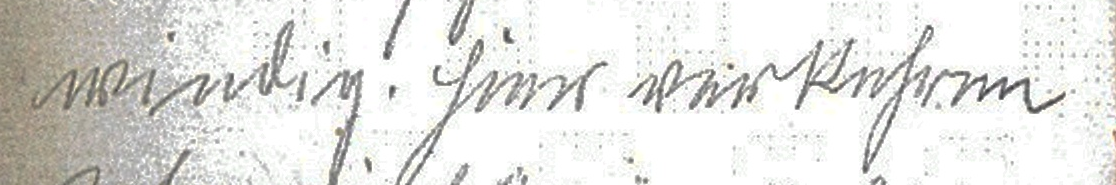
windig. Hier verkehren
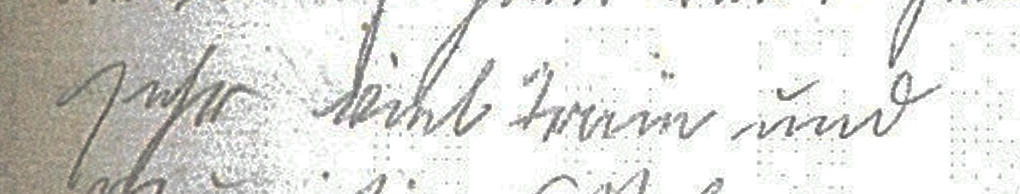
sehr viel Train und
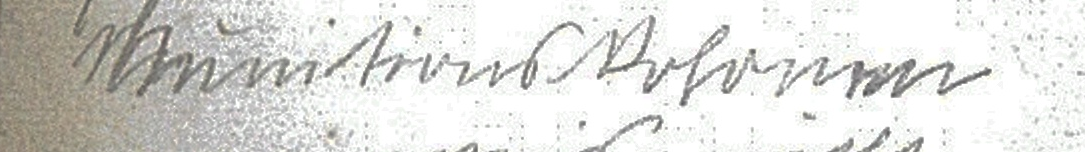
Munitionskolonnen
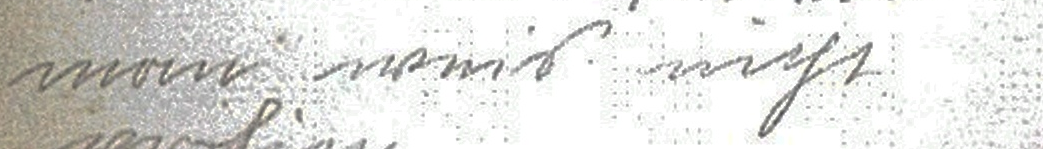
man weis nicht
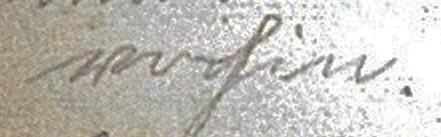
wohin.
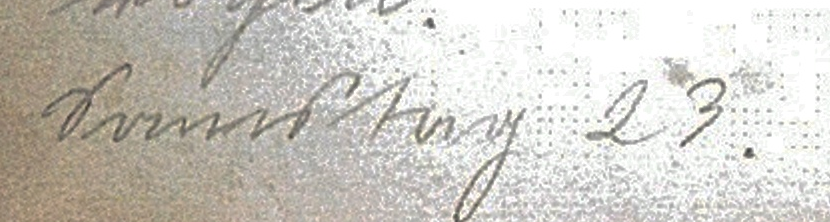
Sonntag 23.
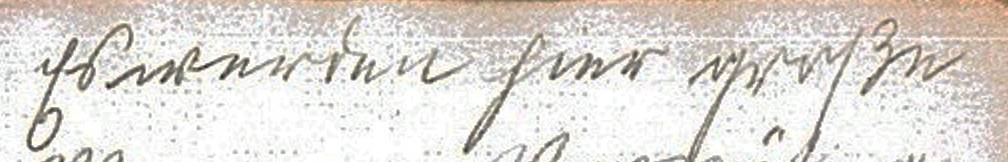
Es werden hier große
